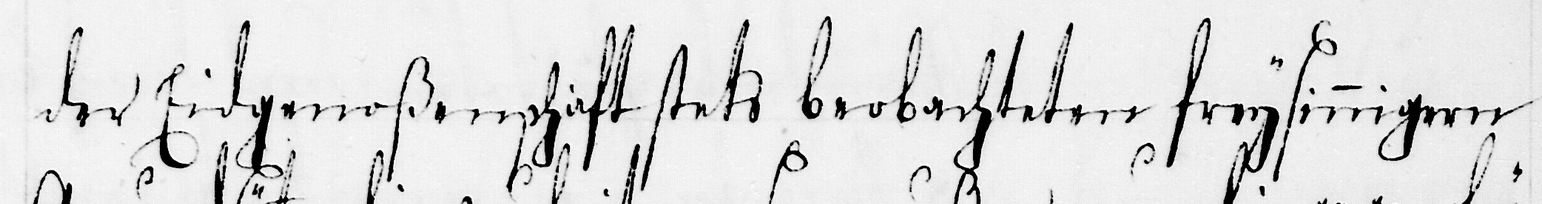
der Eidgenoßenschaft stets beobachteten freysinnigern
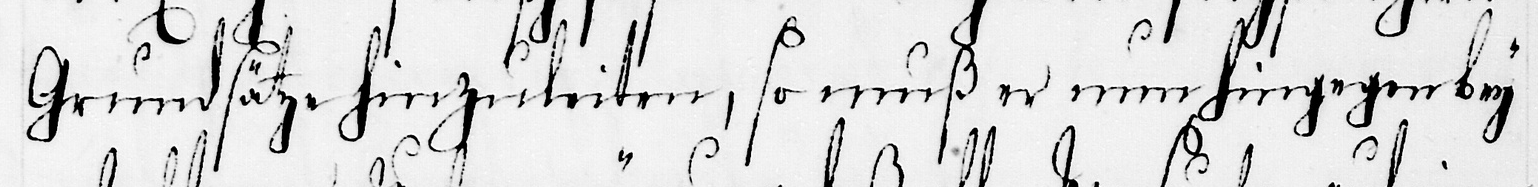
Grundsätze hinzuleiten, so muß er nun hingegen bey
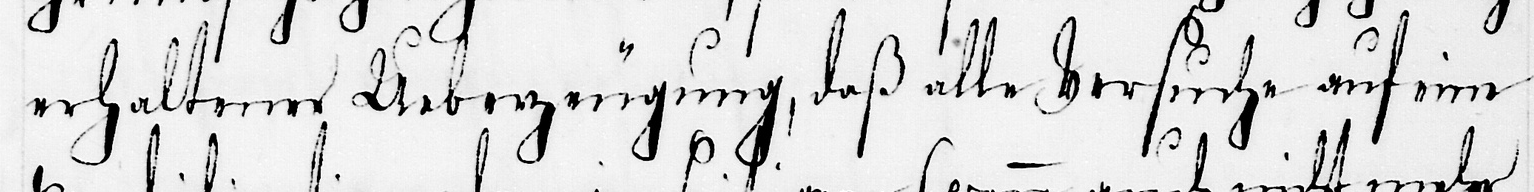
erhaltener Ueberzeugung, daß alle Versuche auf eine
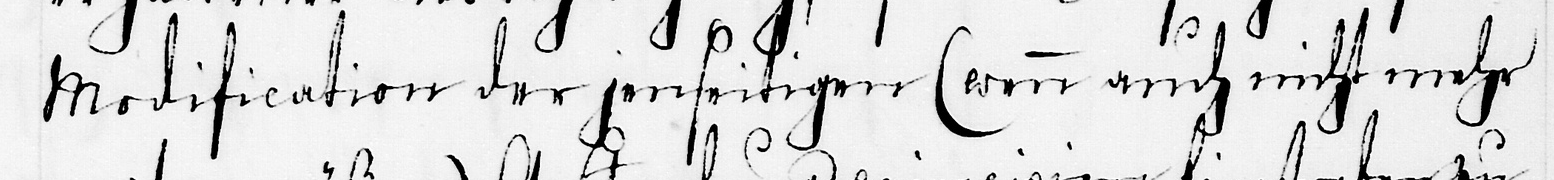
Modification der jenseitigen (wenn auch nicht mehr
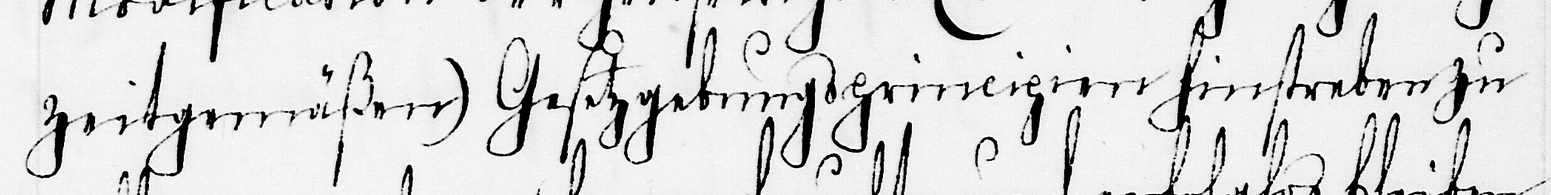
zeitgemäßen) Gesetzgebungsprincipien hinstreben zu
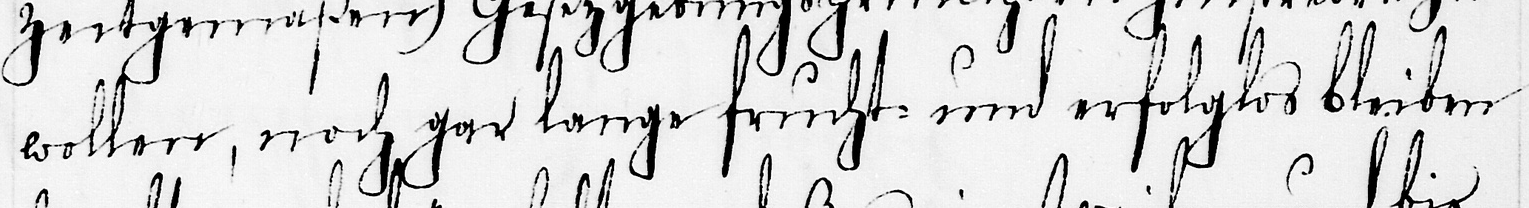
wollen, noch gar lange frucht- und erfolglos bleiben
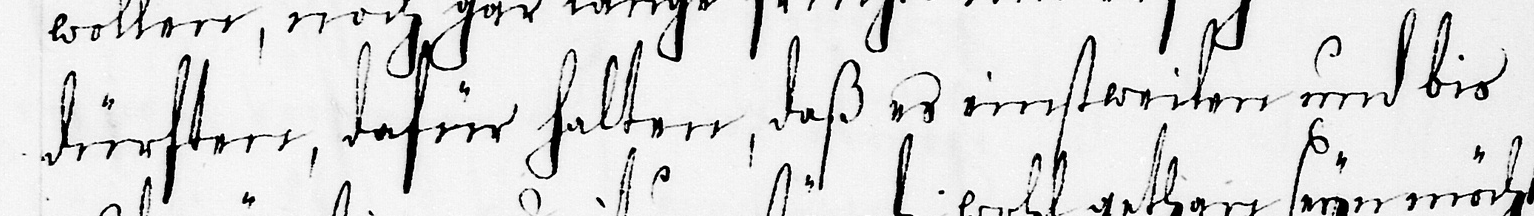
dürften, dafür halten, daß es einstweilen und bis
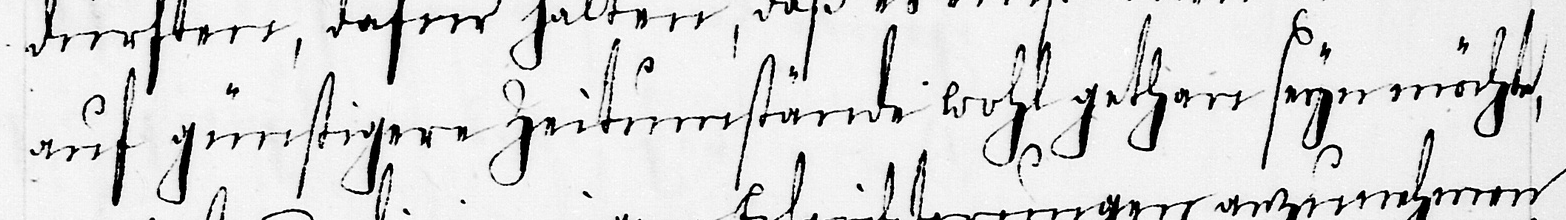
auf günstigere Zeitumstände wohl gethan seyn möchte,
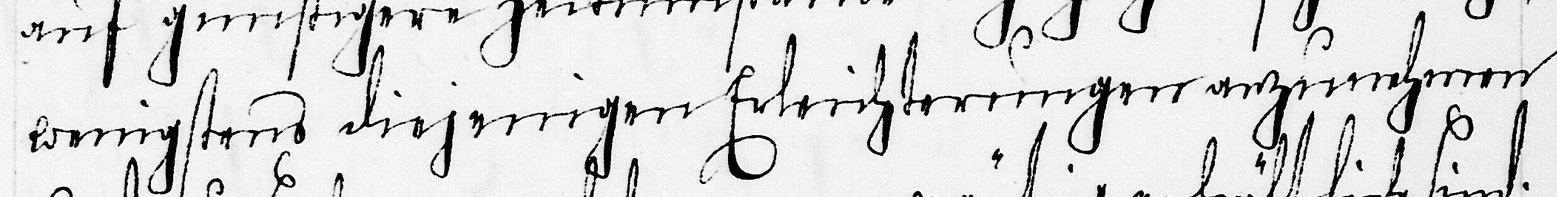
wenigstens diejenigen Erleichterungen anzunehmen
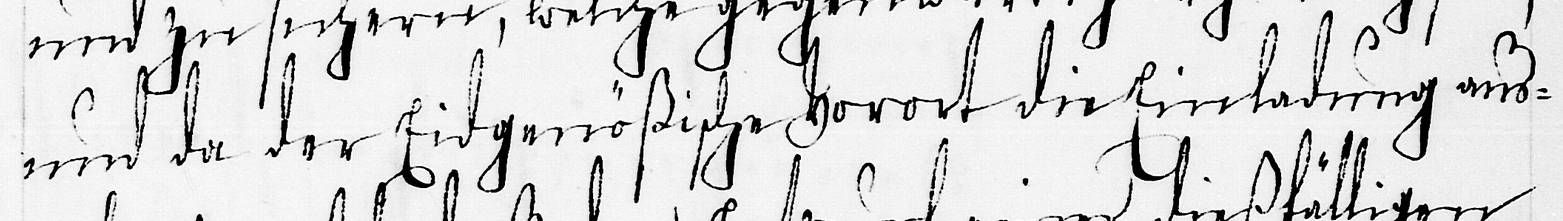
und da der Eidgenößische Vorort die Einladung aus¬
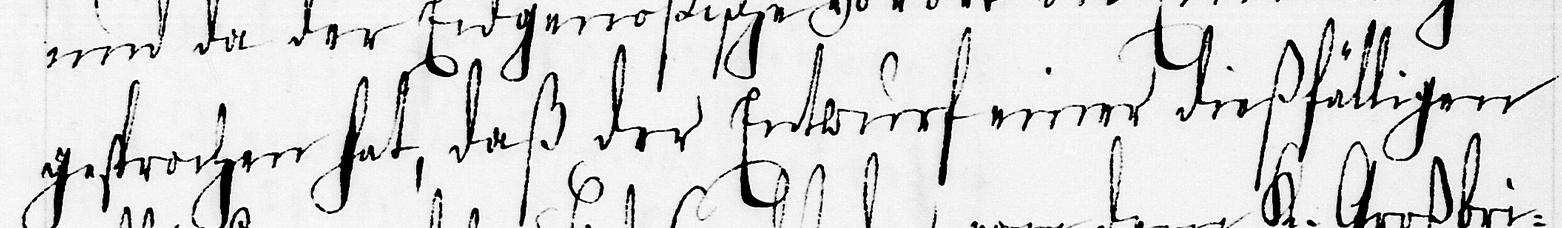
gesprochen hat, daß der Entwurf einer dießfälligen
